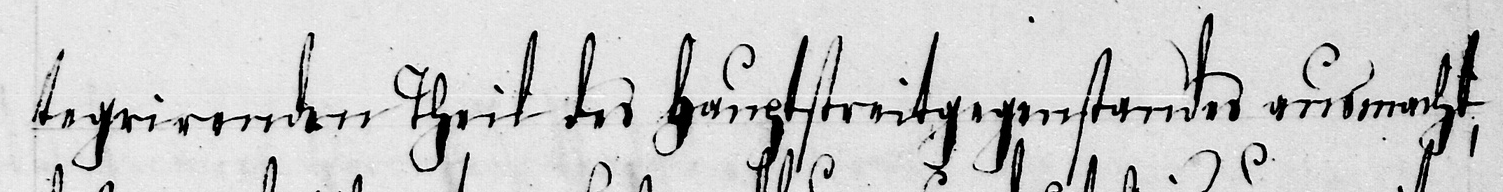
tegrierenden Theil des Hauptstreitgegenstandes ausmacht,
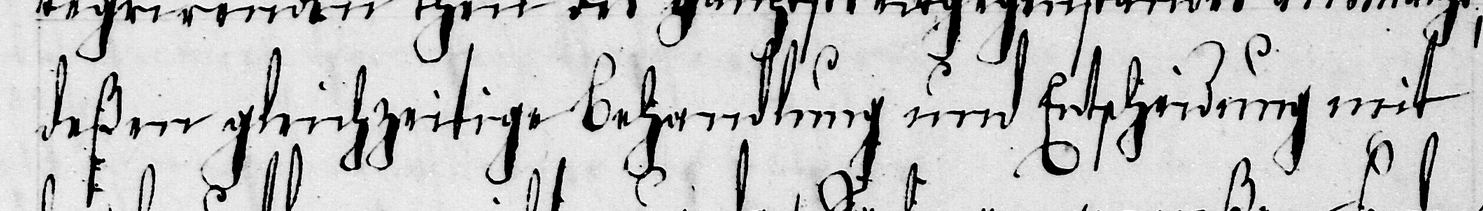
deßen gleichzeitige Behandlung und Entscheidung mit
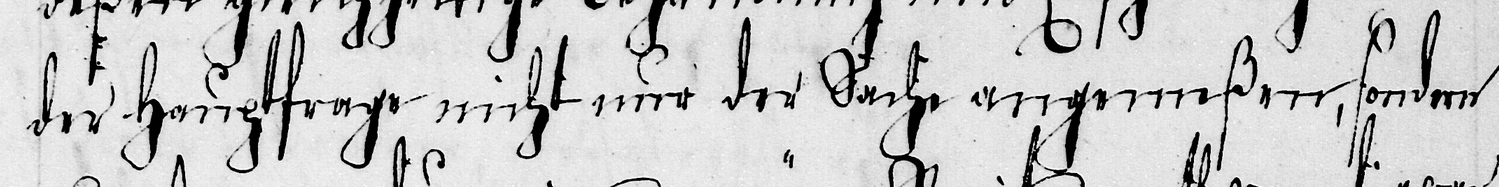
der Hauptfrage nicht nur der Sache angemeßen, sondern
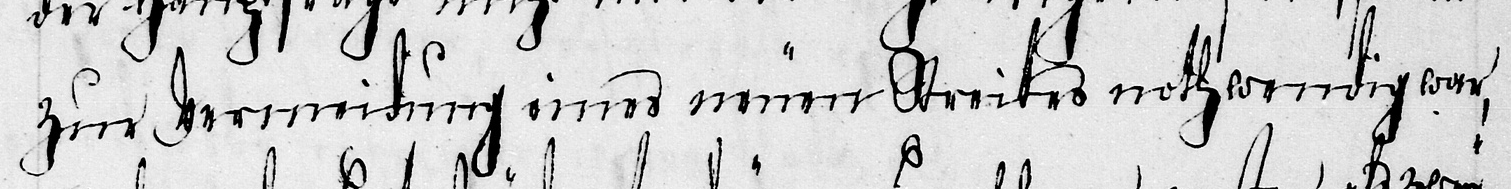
zur Vermeidung eines neuen Streites nothwendig war,
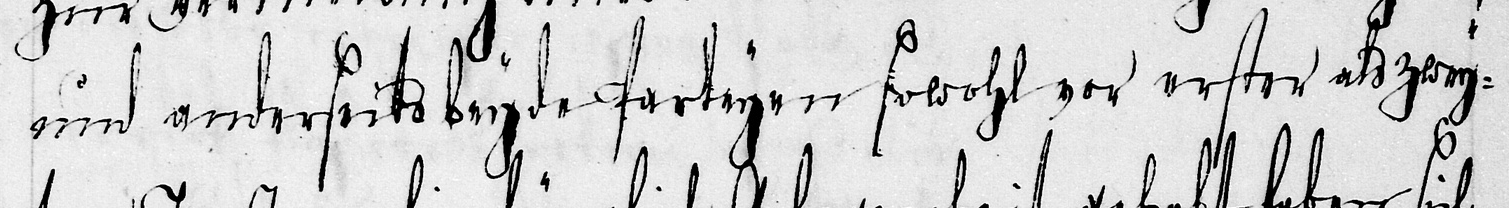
und anderseits beyde Parteyen sowohl vor erster als zwey¬
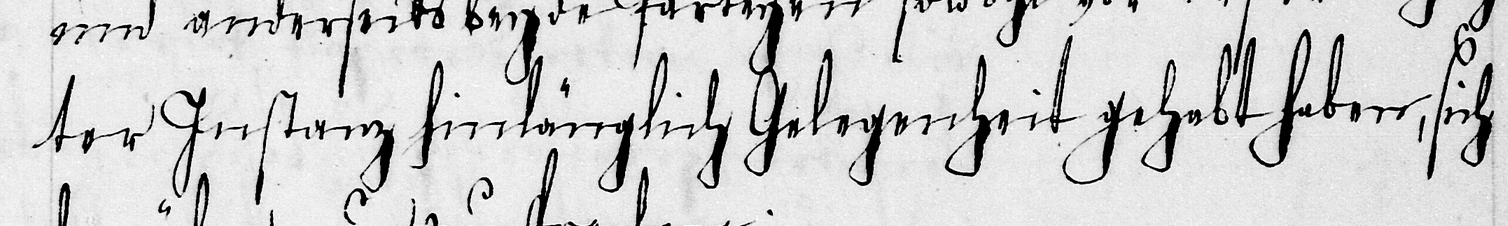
ter Instanz hinlänglich Gelegenheit gehabt haben, si¬
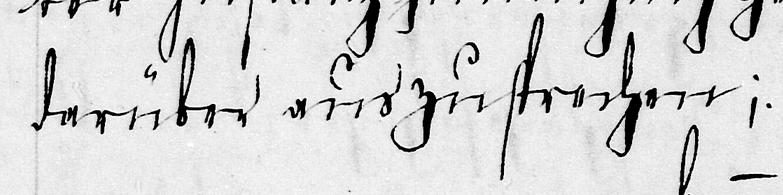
darüber auszusprechen;
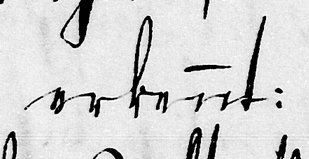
erkennt:
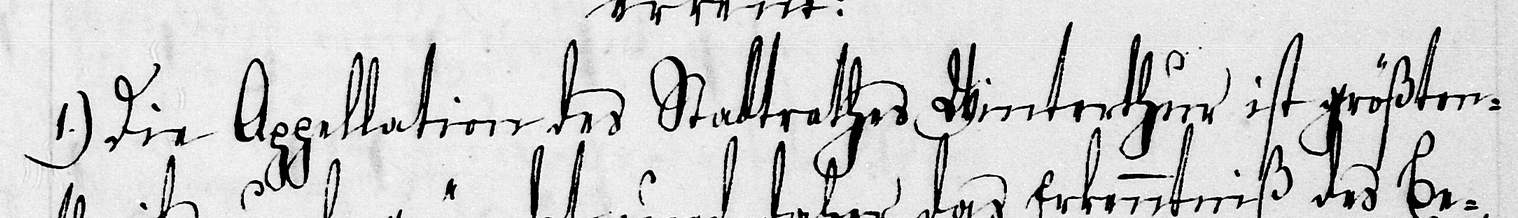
1.) Die Appellation des Stadtrathes Winterthur ist größten¬
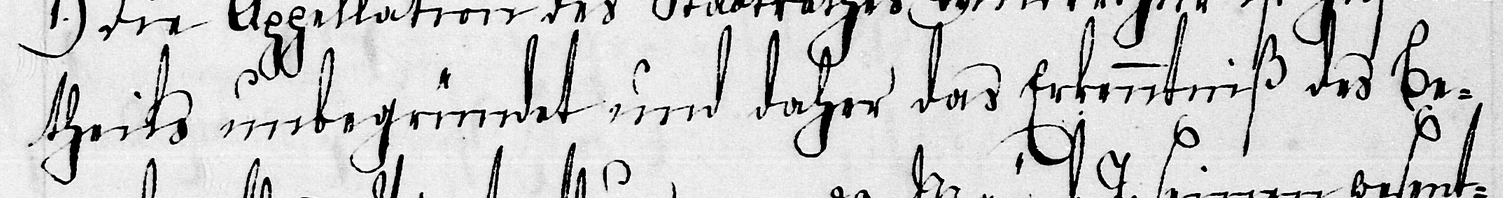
theils unbegründet und daher das Erkenntniß des Be¬
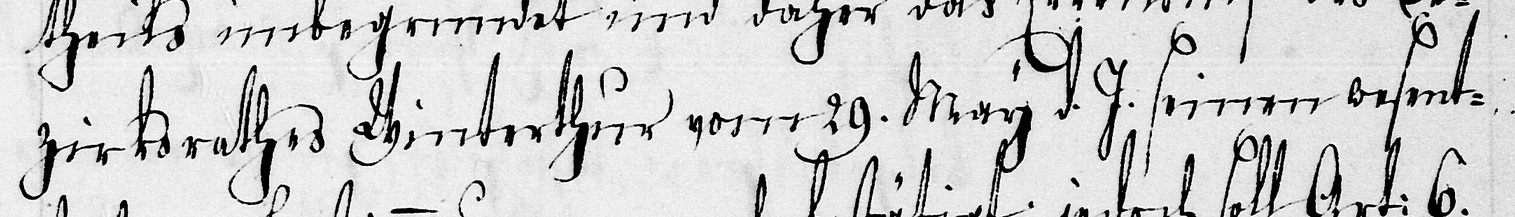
zirksrathes Winterthur vom 29. May d. J. seinen wesent¬
